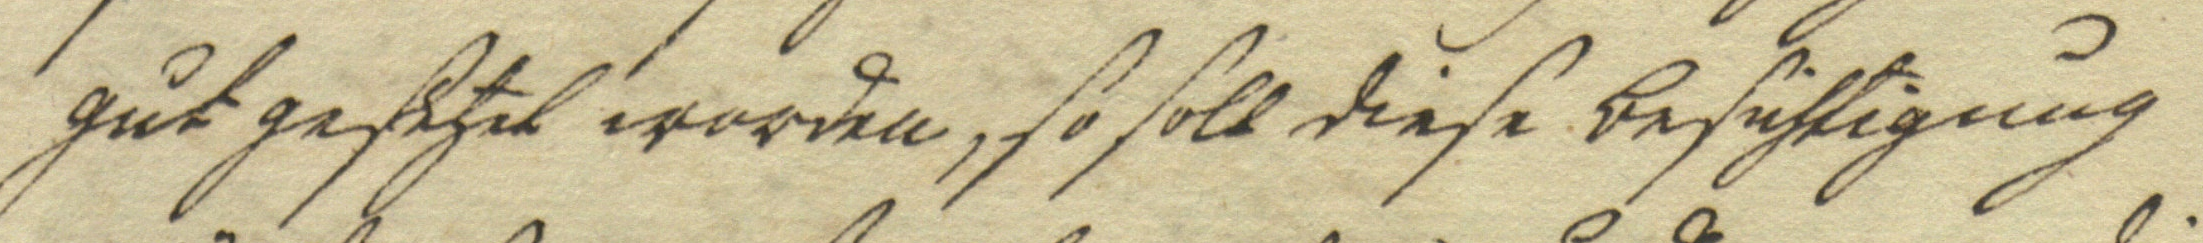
gut gesetzet worden, so soll diese Besichtigung
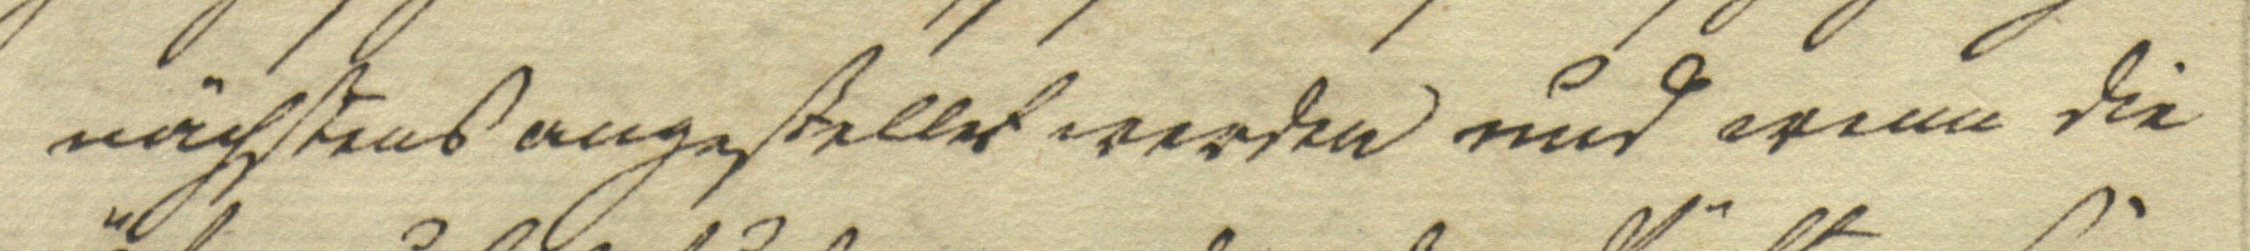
nächstens angestellet werden und wenn die
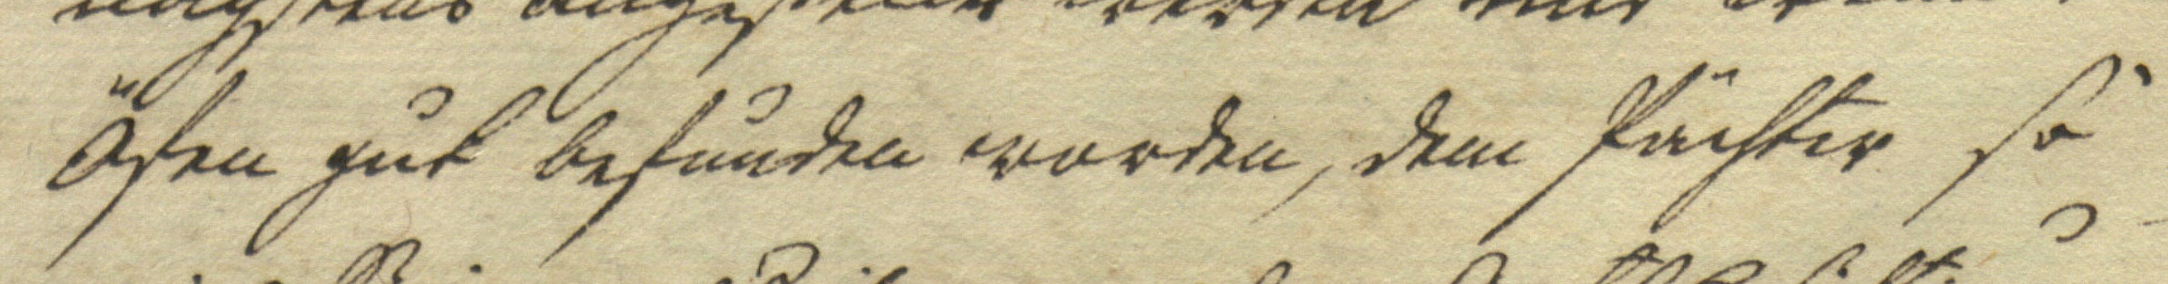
Öfen gut befunden worden, dem Pächter so
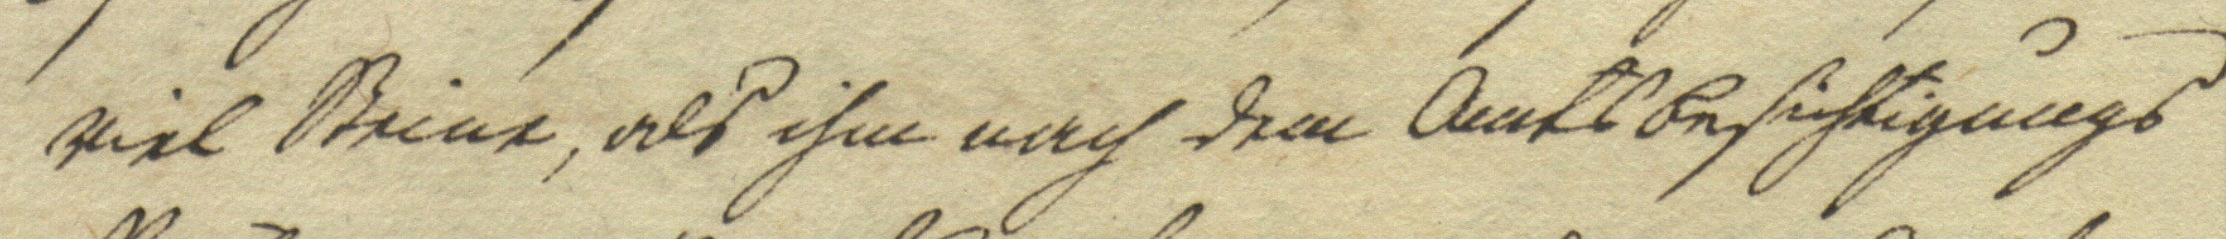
viel Steine, als ihm nach dem Amtsbesichtigungs¬
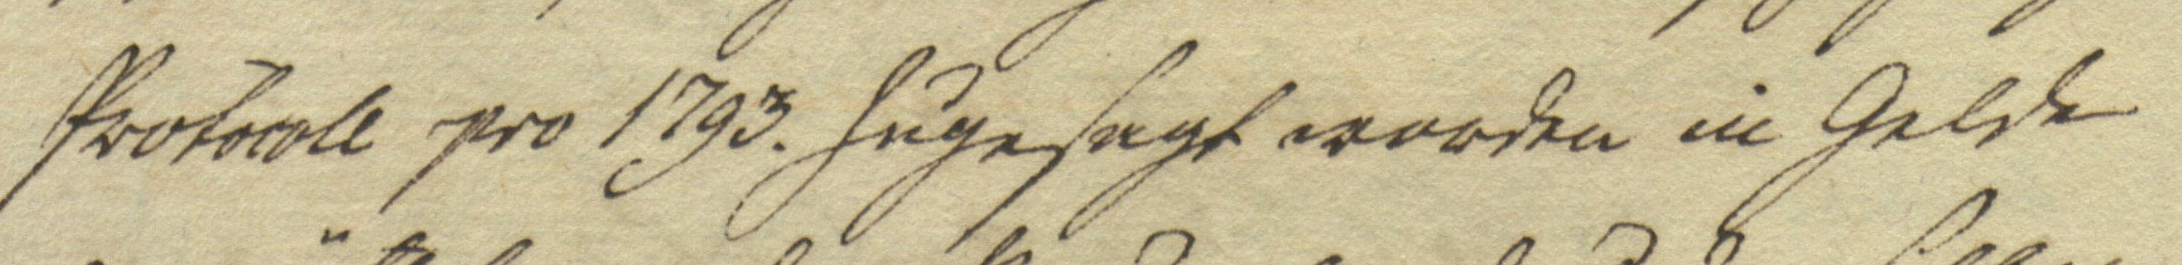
Protocoll pro 1793. zugesagt worden in Gelde
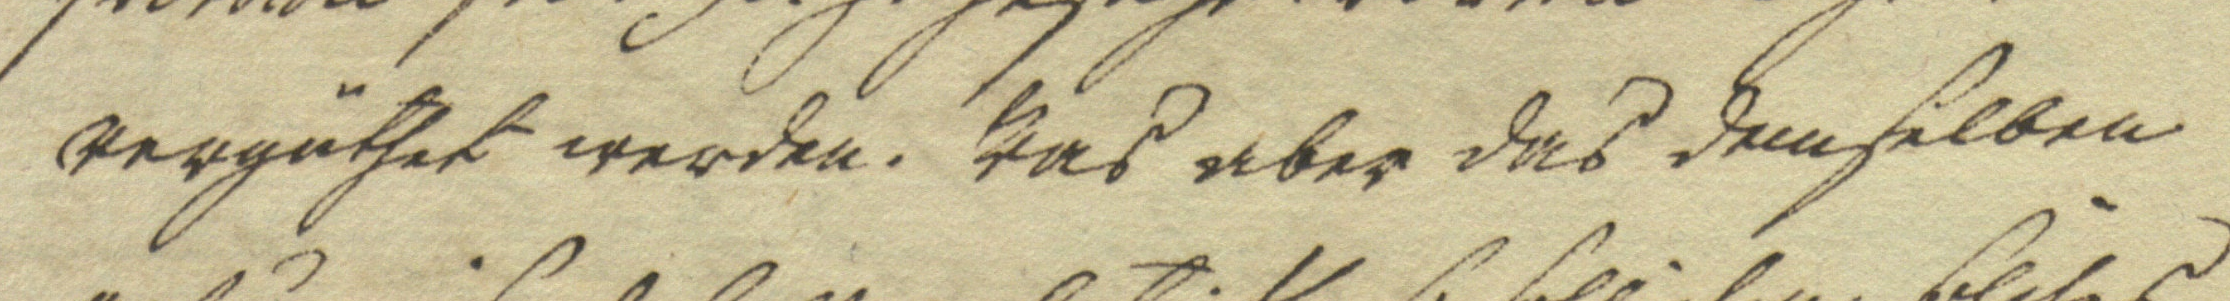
vergüthet werden. Was aber das demselben
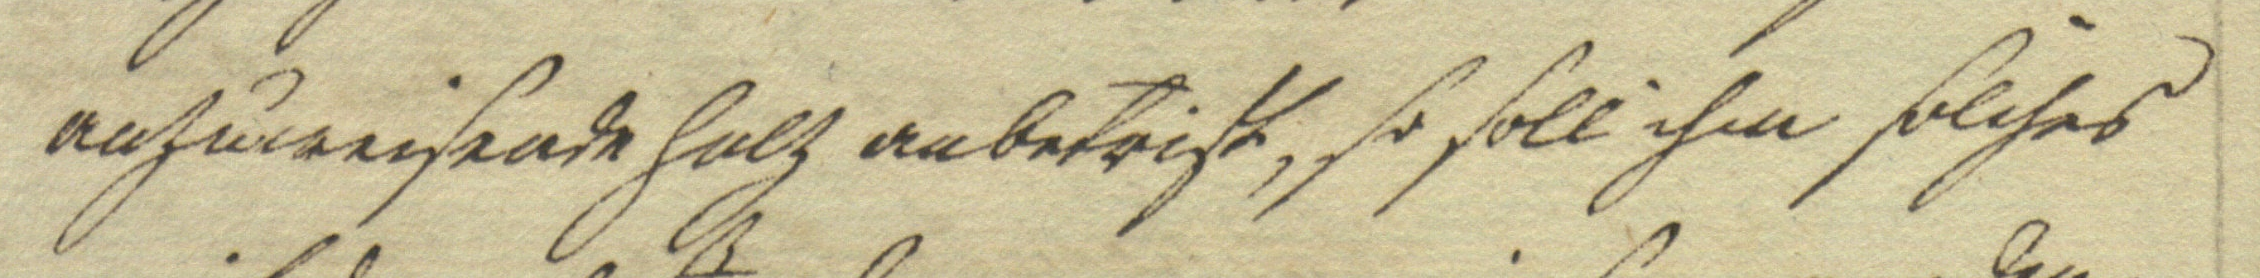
anzuweisende Holz anbeträfe, so soll ihm solches
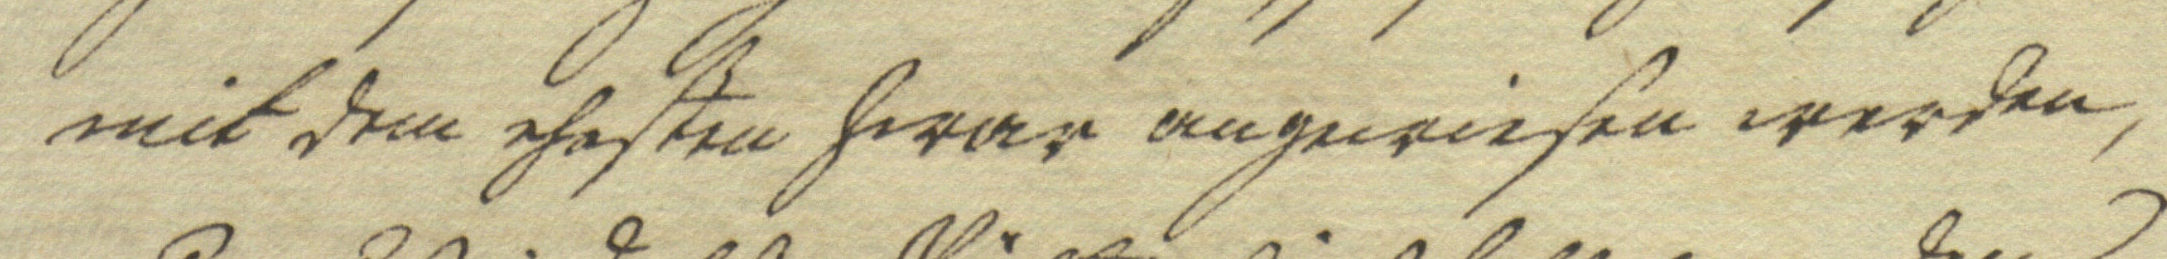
mit dem ehesten zwar angewiesen werden,
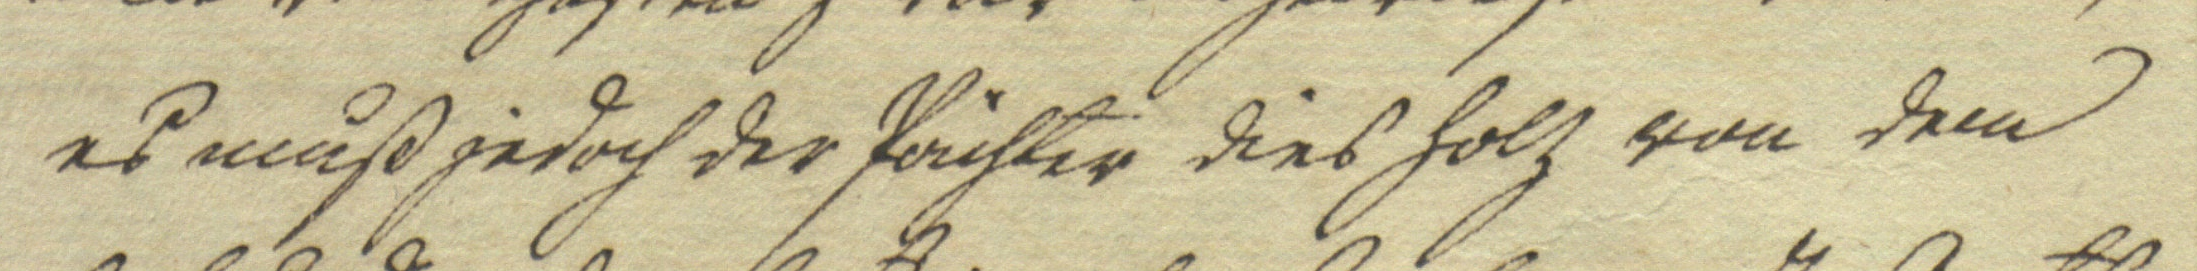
es muß jedoch der Pächter dies Holz von dem
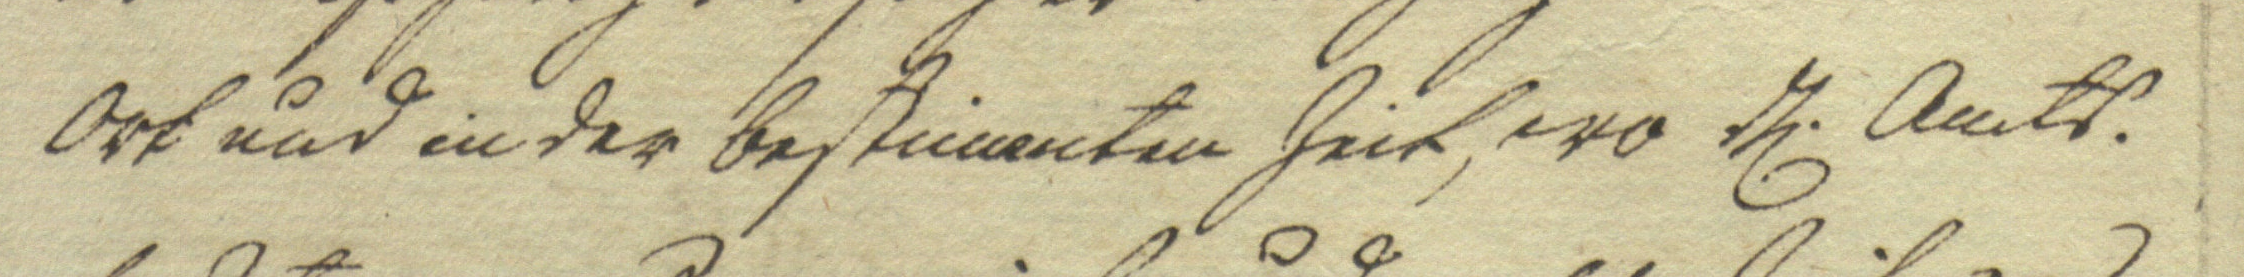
Ort und inder bestimmten Zeit, wo dh. Amts¬
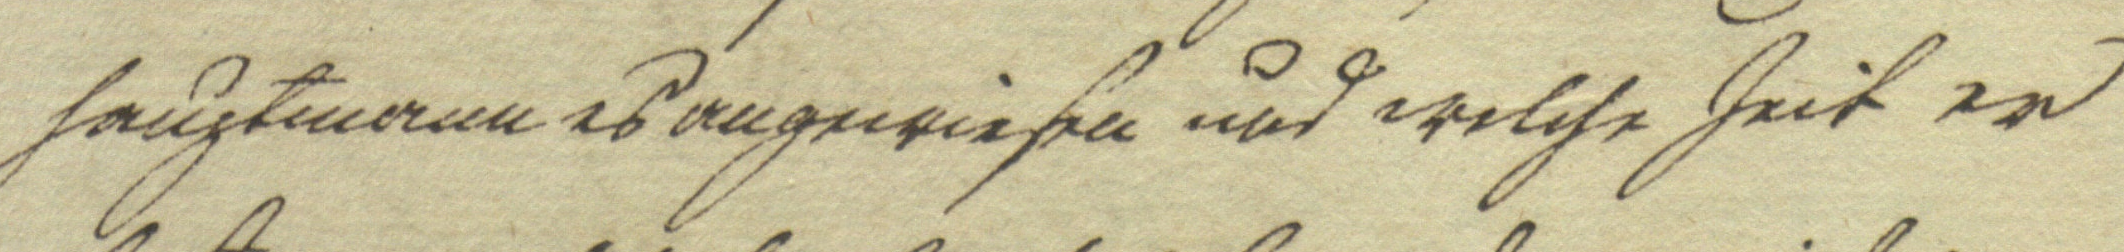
hauptmann es angewiesen und welche Zeit er
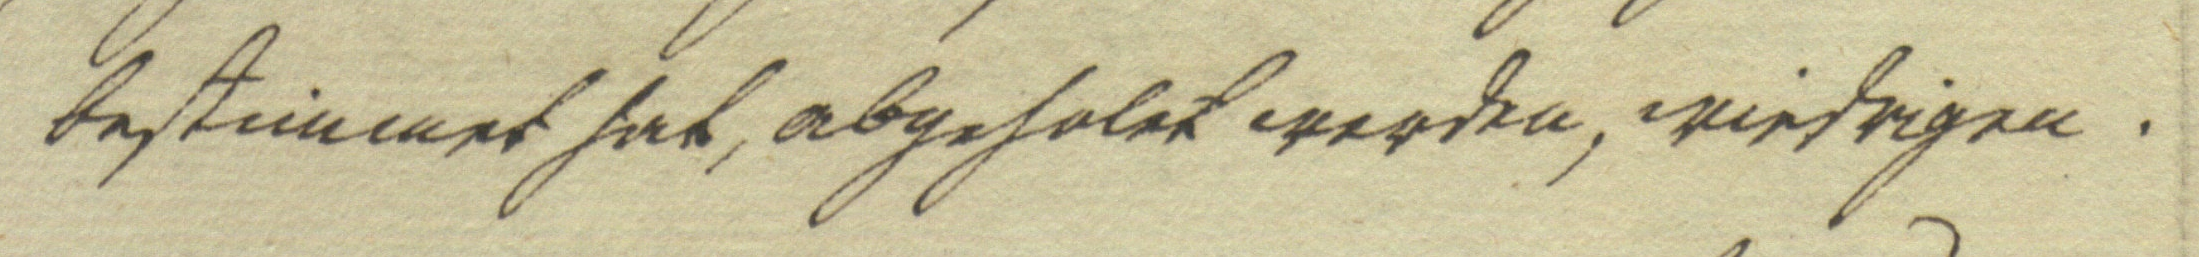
bestimmet hat, abgeholt werden, wiedrigen¬
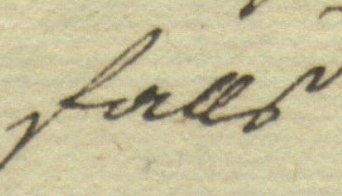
falls
